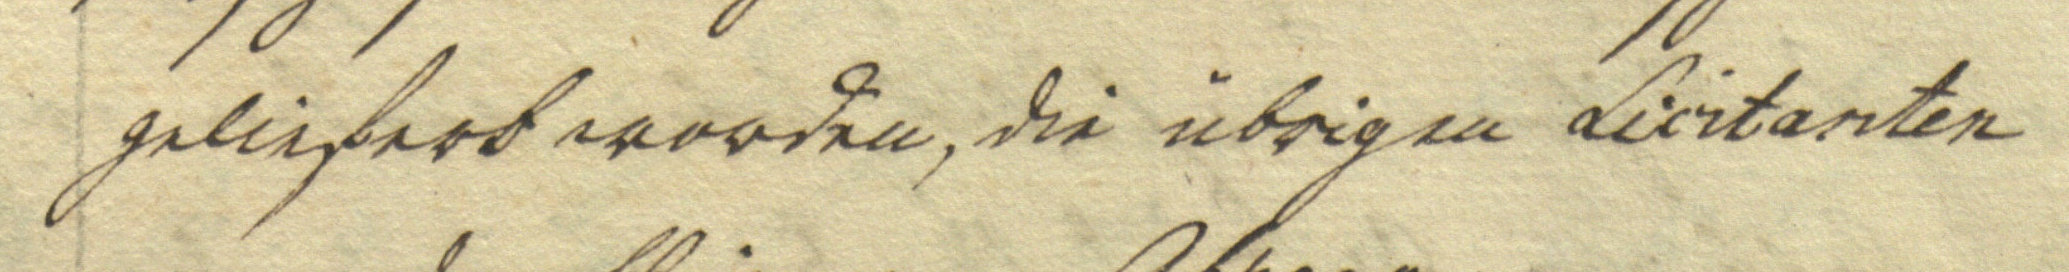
geliefert worden, die übrigen Licitanten
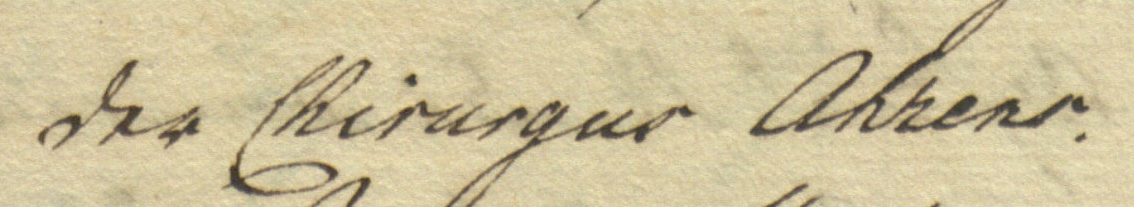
der Chirurgus Ahrens.
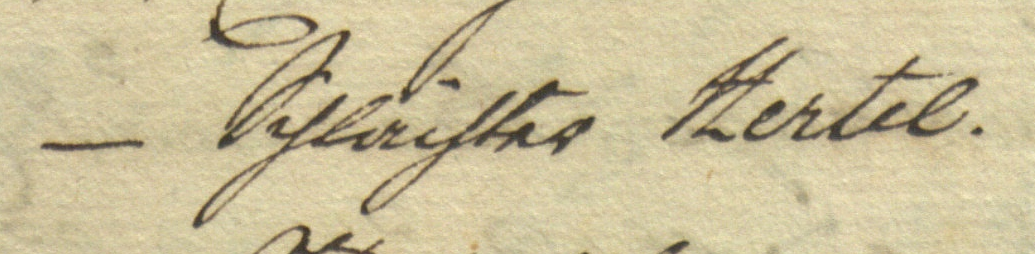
Schlächter Hertel.
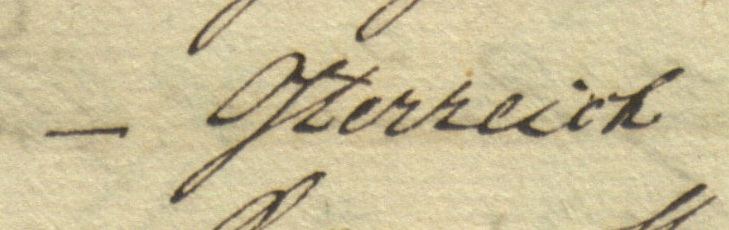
Osterreich.
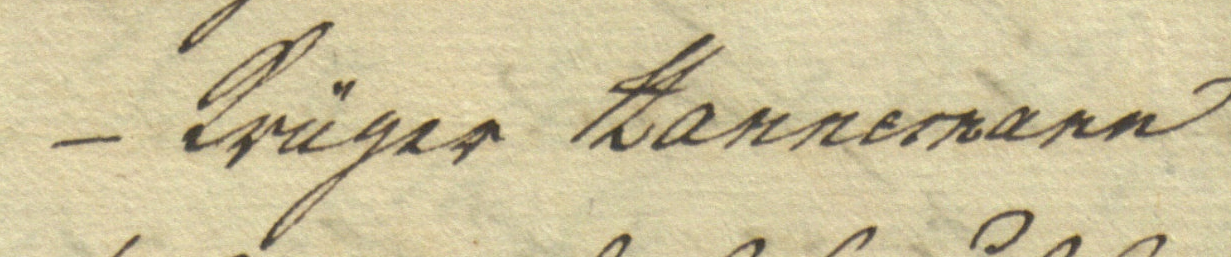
Krüger Hannemann
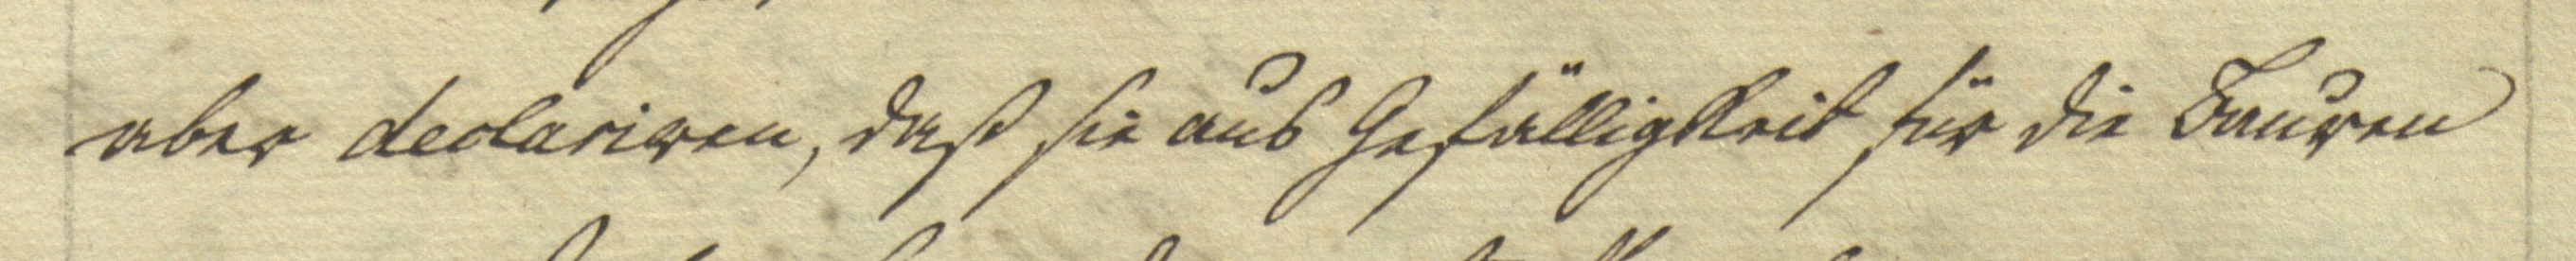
aber declariren, daß sie aus Gefälligkeit für die Bauren
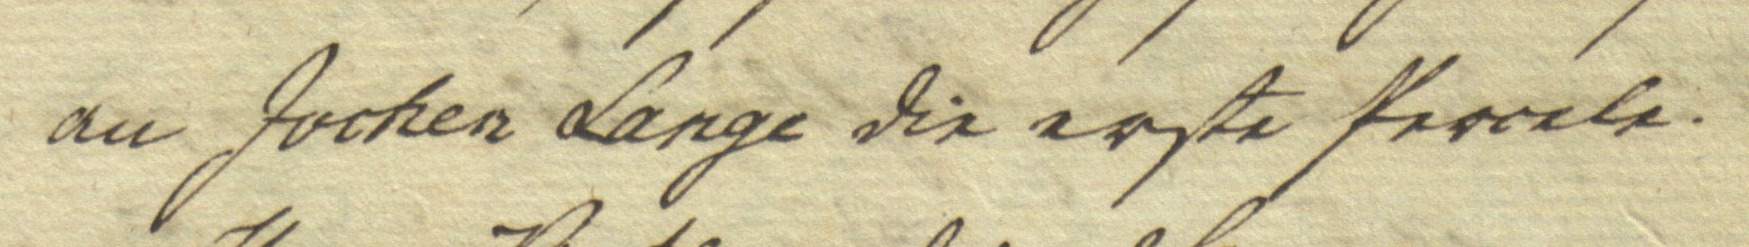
an Jochen Lange die erste Percele.
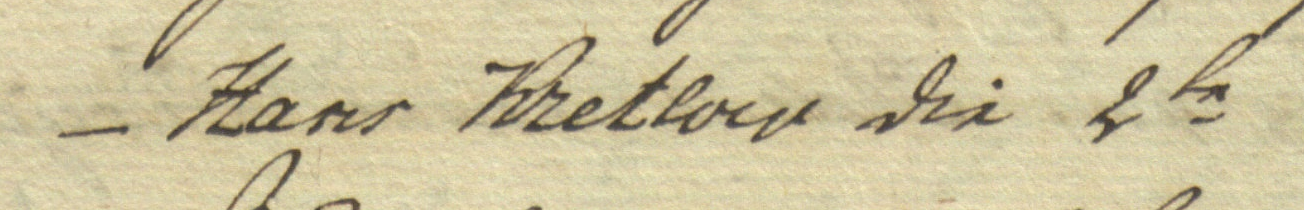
Hans Kretlow die 2 te
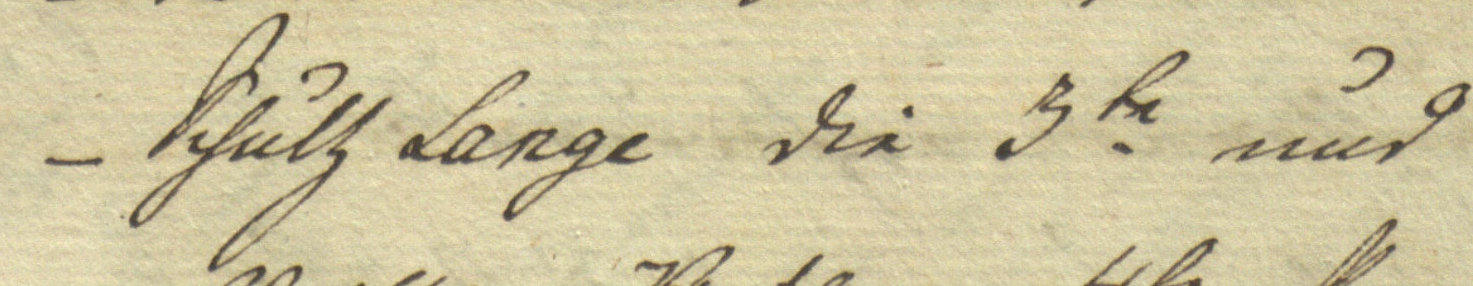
Schulz Lange die 3 te und
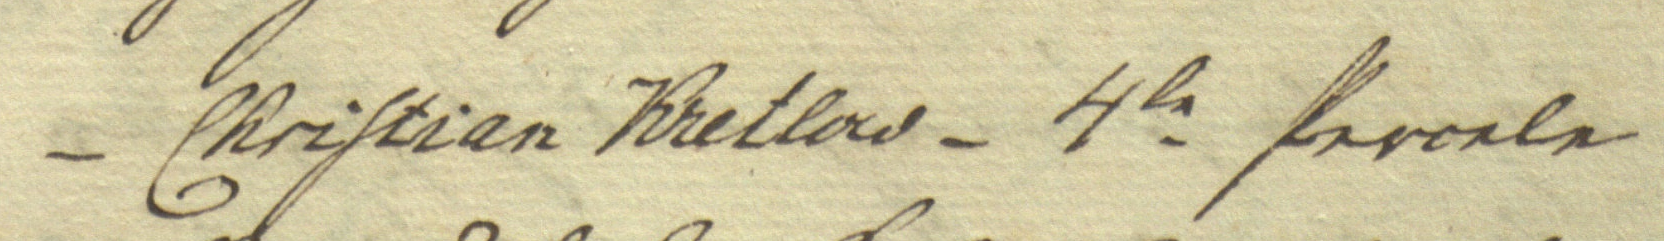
Christian Kretlow 4 te Percele
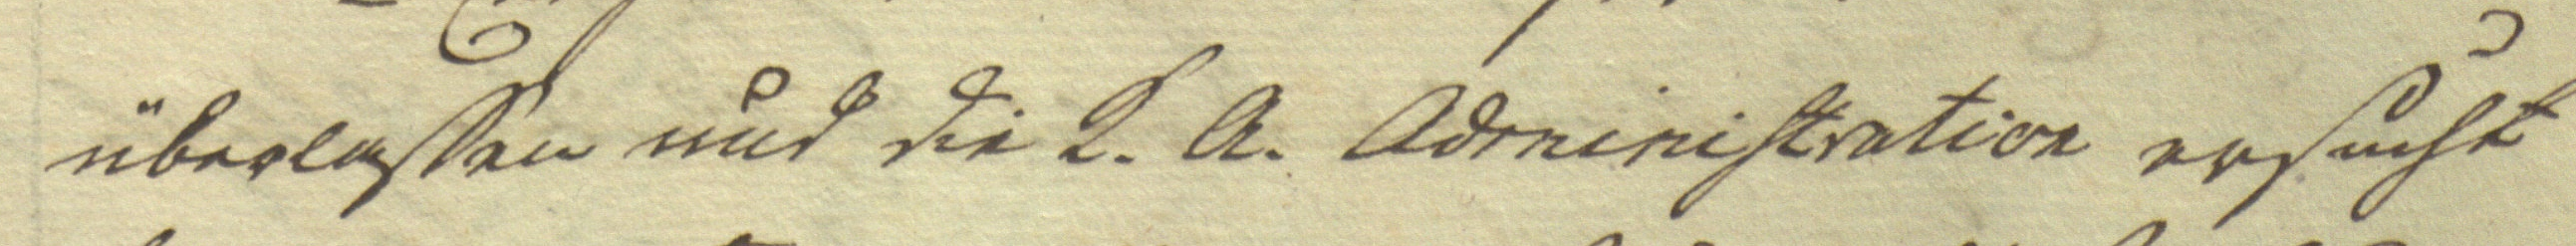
überlassen und die K. A. Administration ersucht
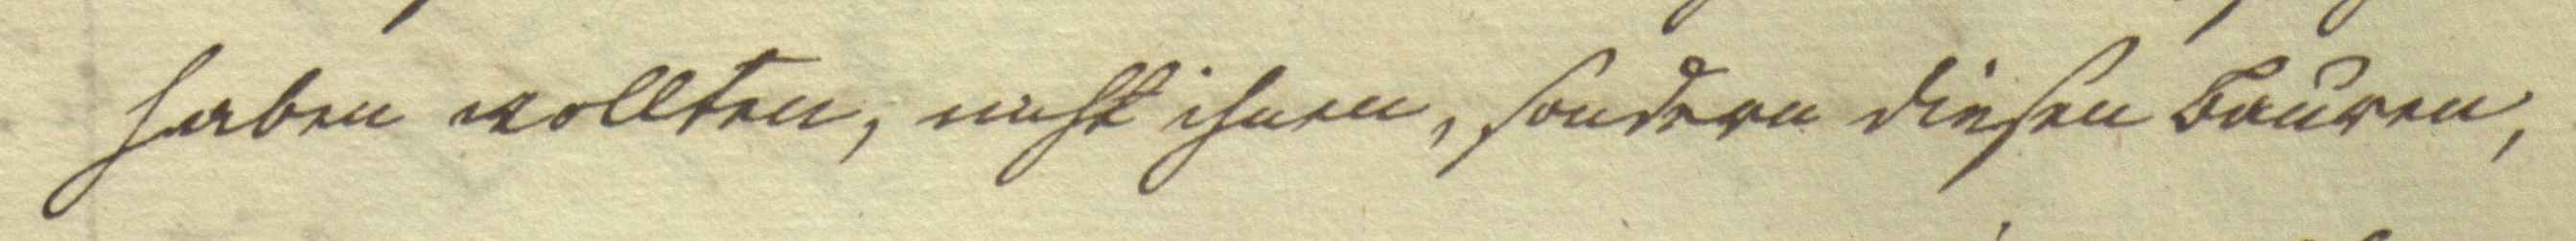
haben wollten, nicht ihnen, sondern diesen Bauren,
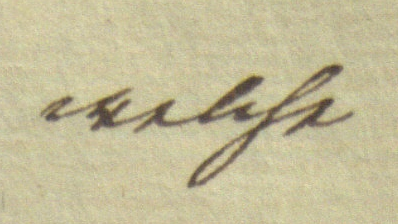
welche
